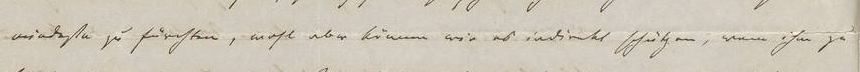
mindeste zu fürchten, wohl aber können wir es indirekt schützen, wenn ihm zu
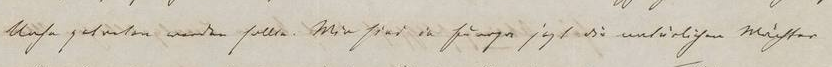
Nahe getreten werden sollte. Wir sind in Europa jezt die natürlichen Wächter
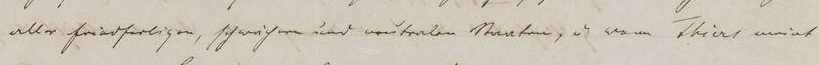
aller friedfertigen, schwächern und neutralen Staaten, u wenn Thiers meint
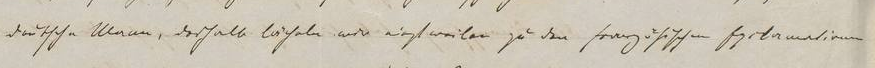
deutsche Mann, deshalb lächeln wir einstweilen zu den französischen Exclamationen
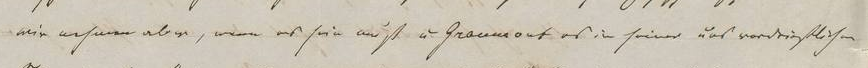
wir nehmen aber, wenn es sein muß u Grammont es in seiner uns verdrießlichen
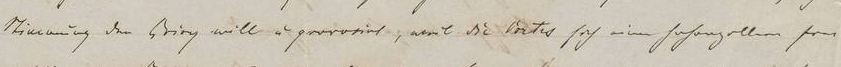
Stimmung den Krieg will u provocirt, weil die Cortes sich einen Hohenzollern frei
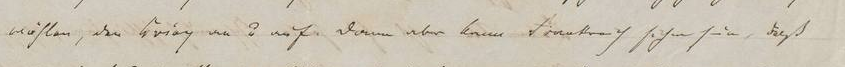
wählen, den Krieg an u auf. Dann aber kann Frankreich sicher sein, daß
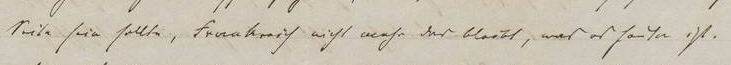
Seite sein sollte, Frankreich nicht mehr das bleibt, was es heute ist.
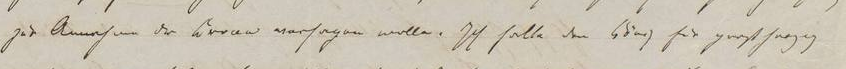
zur Annahme der Krone versagen wolle. Ich halte den König für großherzig
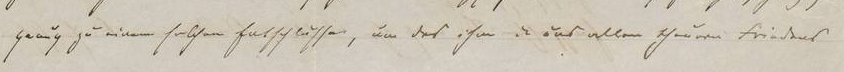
genug zu einem solchen Entschlusse, um des ihm u uns allen theuern Friedens
